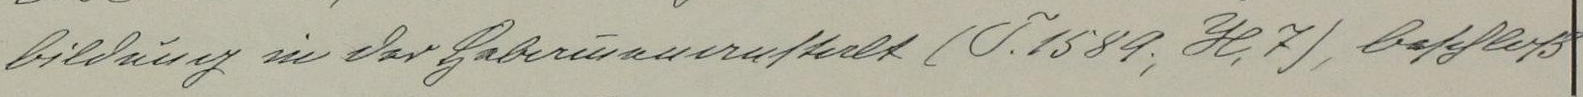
bildung in der Hebammenanstalt (T.1589; H.7), beschloß
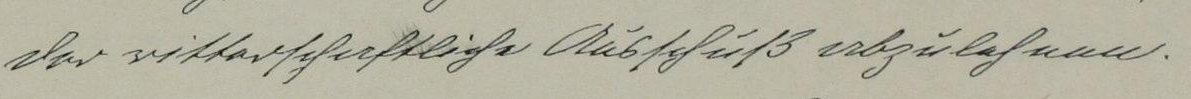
der ritterschaftliche Ausschuß abzulehnen.
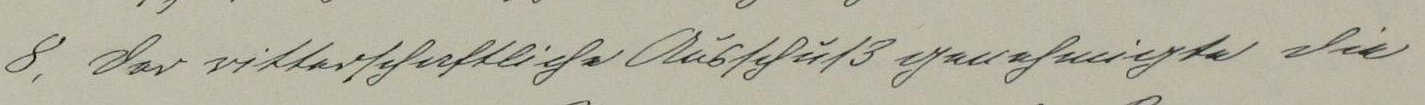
8. Der ritterschaftliche Ausschuß genehmigte die
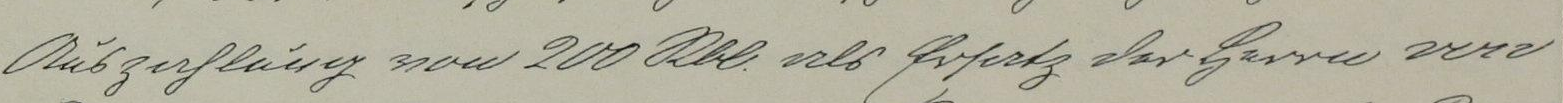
Auszahlung von 200 Rbl. als Ersatz der Herrn von
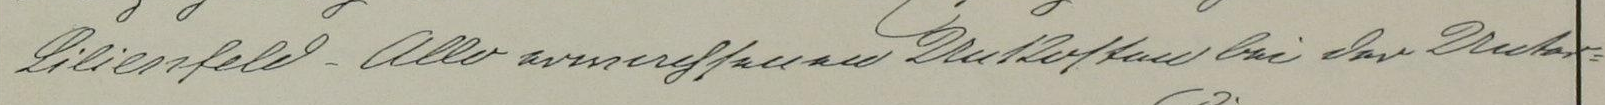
Lilienfeld-Allo erwachsenen Unkosten bei der Unter-
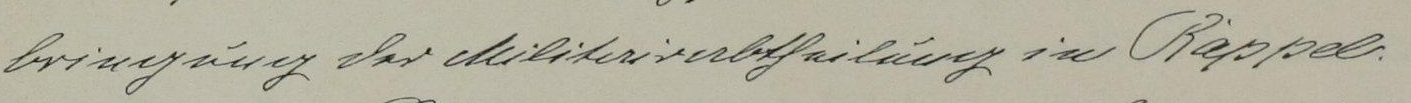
bringung der Militairabtheilung in Rappel.
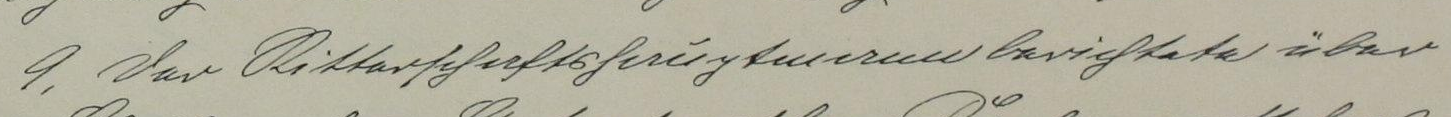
9. Der Ritterschaftshauptmann berichtete über
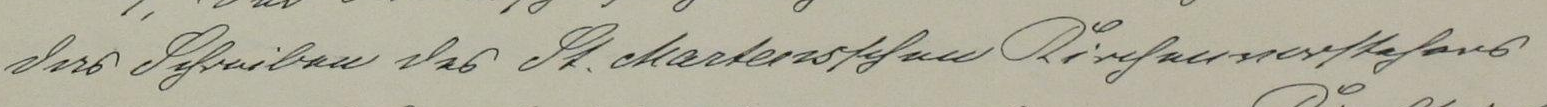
das Schreiben des St. Martensschen Kirchenvorstehers
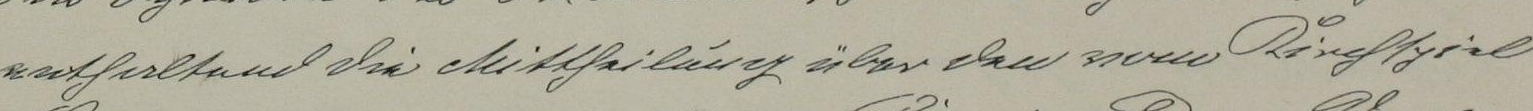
enthaltend die Mittheilung über den vom Kirchspiel
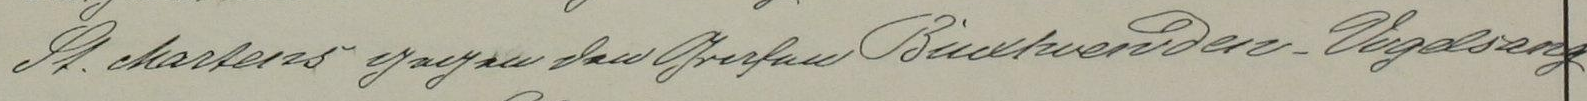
St. Martens gegen den Grafen Buxhoewden-Vogelsang
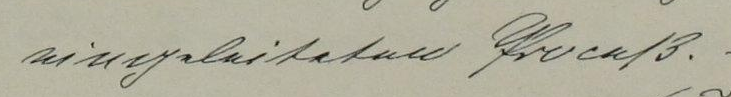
eingeleiteten Proceß.
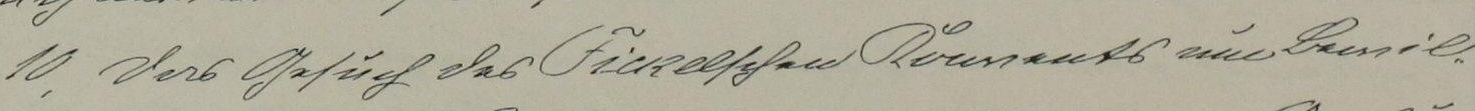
10. Das Gesuch des Fickelschen Konvents um Bewil-
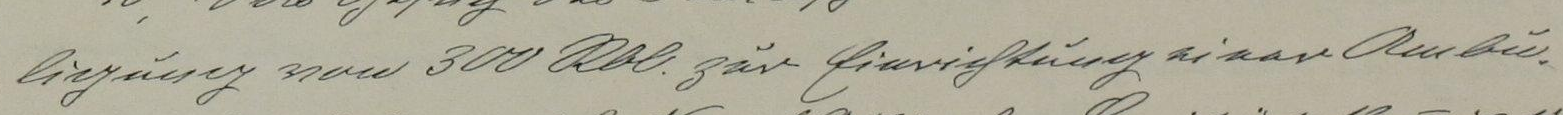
ligung von 300 Rbl. zur Einrichtung einer Ambu-
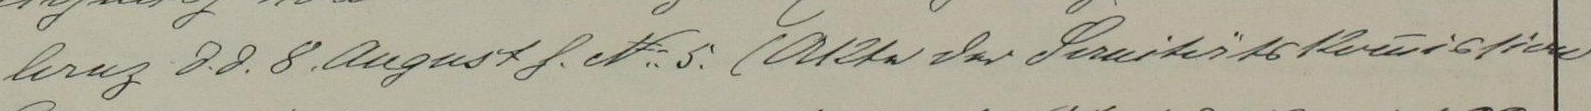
lanz d.d. 8. August s. No. 5. (Akte der Sanitätskommission
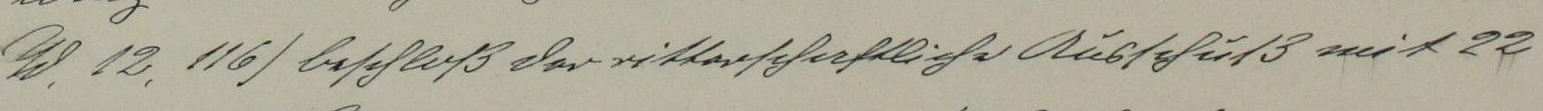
W.12, 116) beschloß der ritterschaftliche Ausschuß mit 22
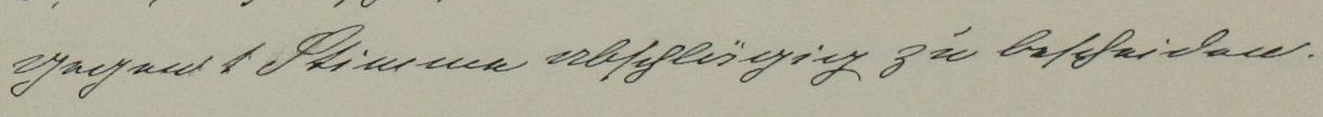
gegen 1 Stimme abschlägig zu bescheiden.
